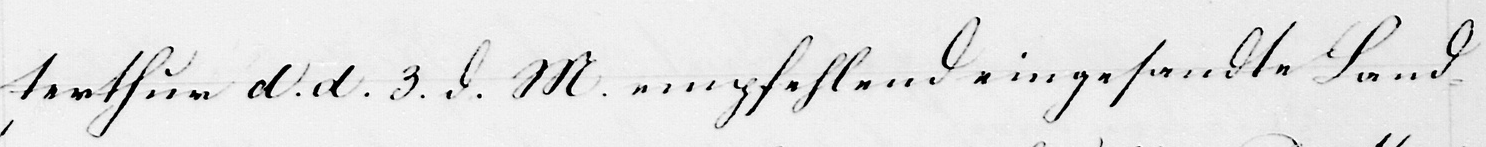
terthur d. d. 3. d. M. empfehlend eingesandte Land¬
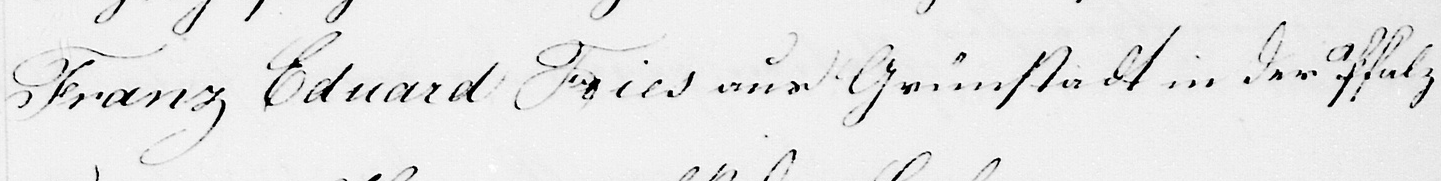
Franz Eduard Fries aus Grünstadt in der Pfalz
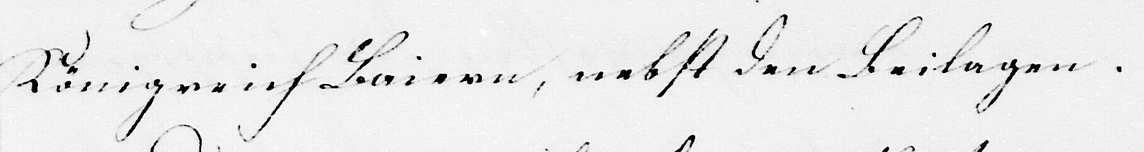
Königreich Baiern, nebst den Beilagen.
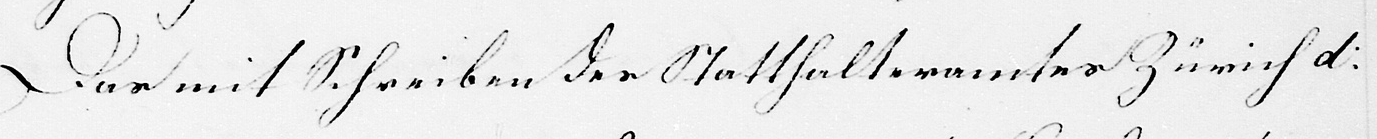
Das mit Schreiben des Statthalteramtes Zürich d.
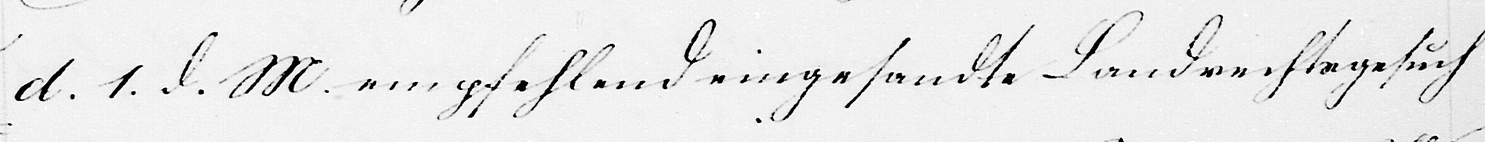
d. 1. d. M. empfehlend eingesandte Landrechtsgesuch
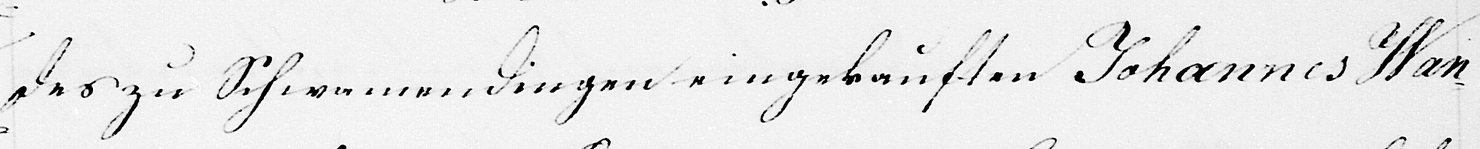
des zu Schwamendingen eingekauften Johannes Wan¬
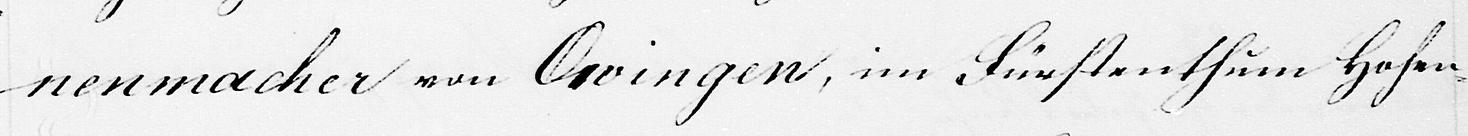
nenmacher von Owingen, im Fürstenthum Hohen¬
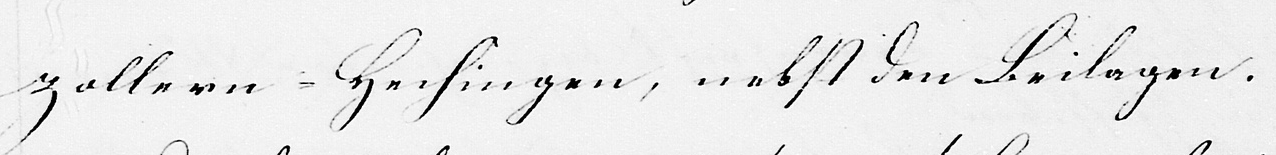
zollern-Hechingen, nebst den Beilagen.
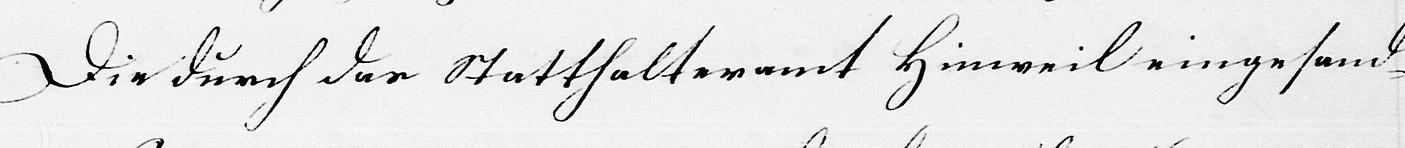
Die durch das Statthalteramt Hinweil eingesand¬
